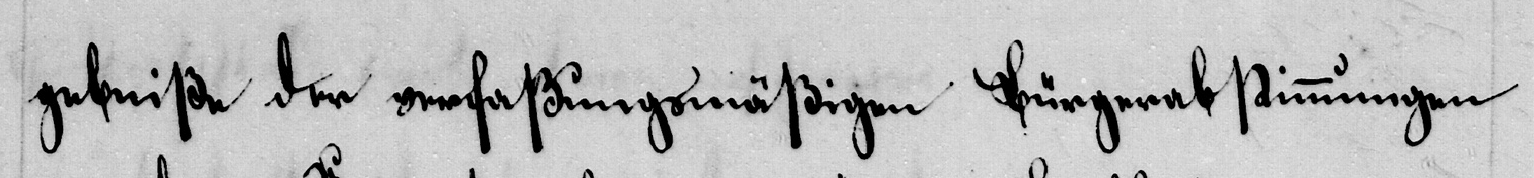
gebniße der verfaßungsmäßigen Bürgerabstimmungen
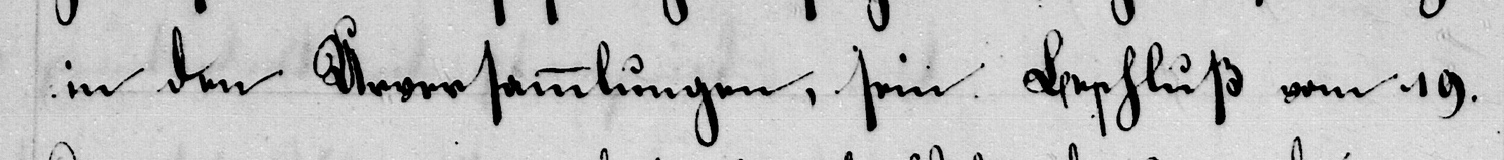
in den Urversammlungen, sein Beschluß vom 19.
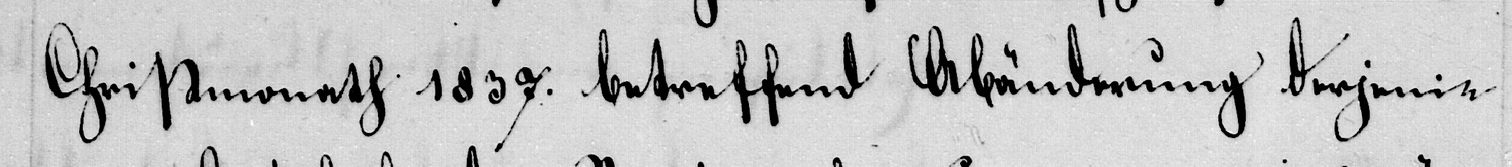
Christmonath 1837. betreffend Abänderung derjeni¬
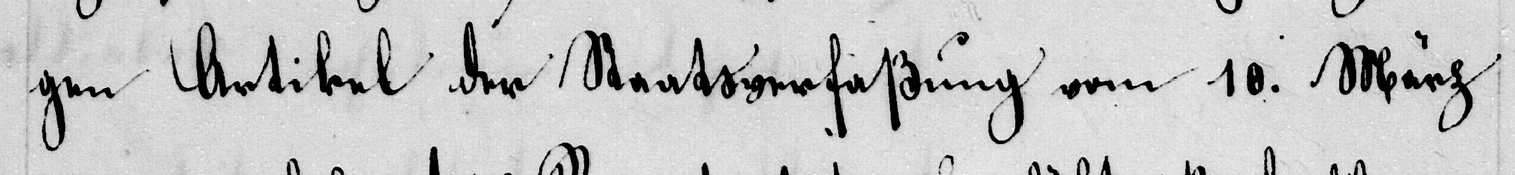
gen Artikel der Staatsverfaßung vom 10. März
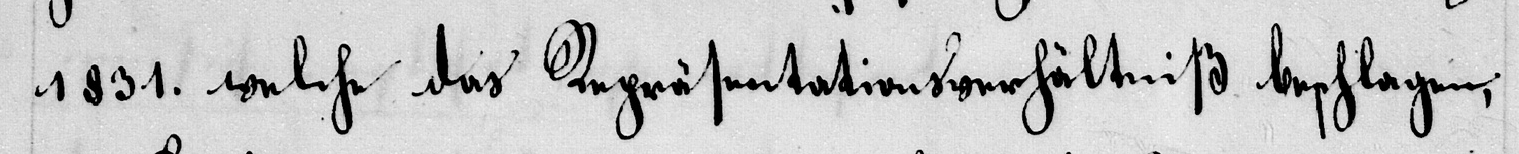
1831. welche das Repräsentationsverhältniß beschlagen,
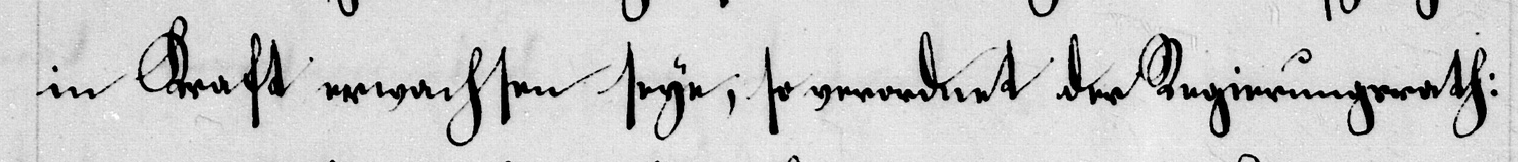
in Kraft erwachsen seyn, so verordnet der Regierungsrath:
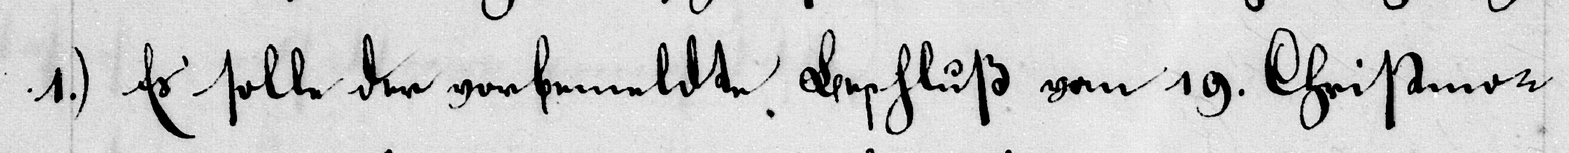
1.) Es solle der vorbemeldte Beschluß vom 19. Christmo¬
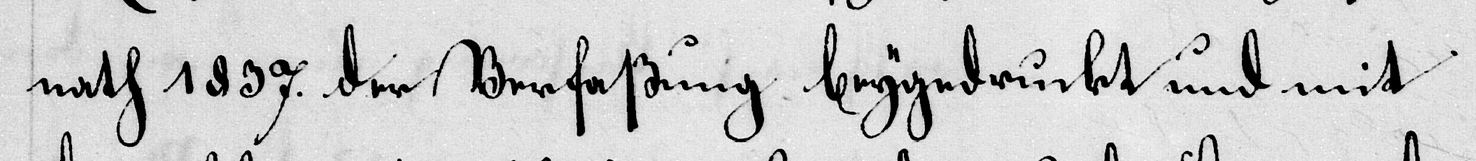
nath 1837. der Verfaßung beygedruckt und mit
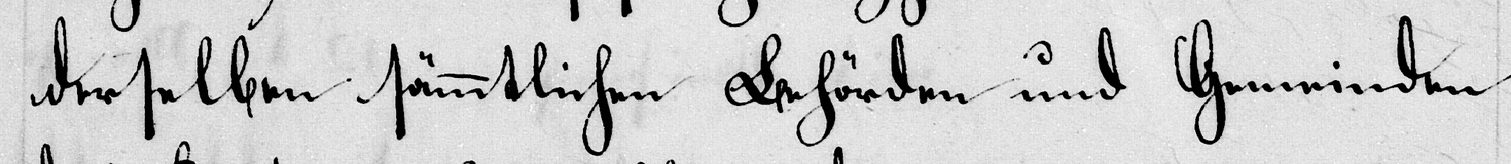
derselben sämmtlichen Behörden und Gemeinden
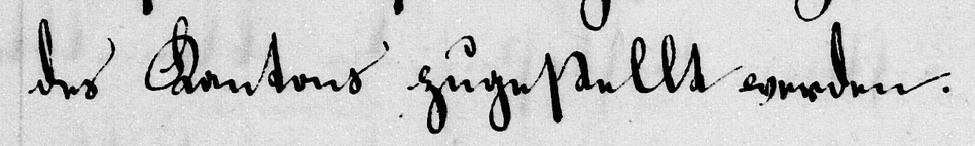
des Kantons zugestellt werden.
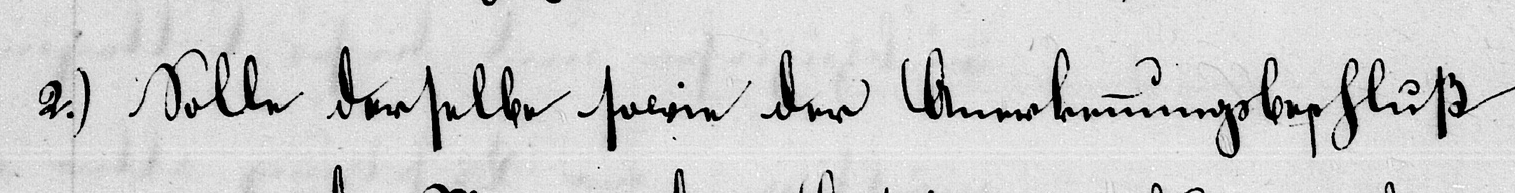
2.) Solle derselbe sowie der Anerkennungsbeschluß
